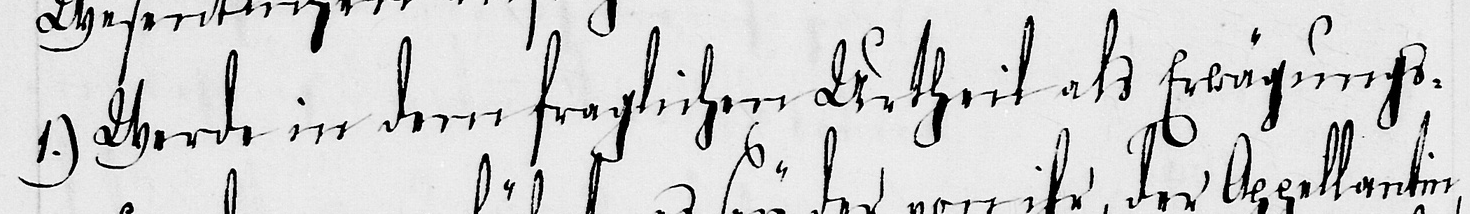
1.) Werde in dem fraglichen Urtheil als Erwägungs¬
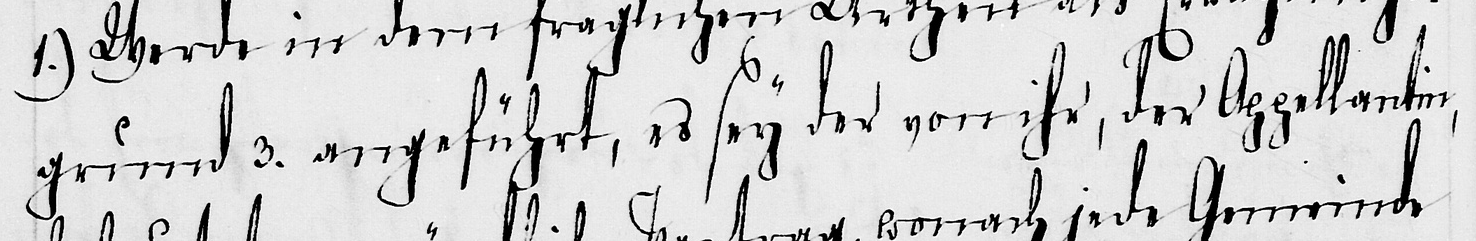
grund 3. angeführt, es sey der von ihr, der Appellan¬
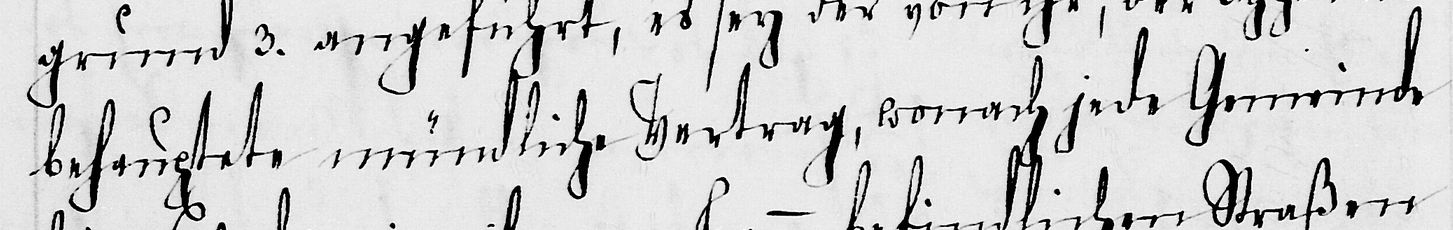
behauptete mündliche Vertrag, wonach jede Gemeinde
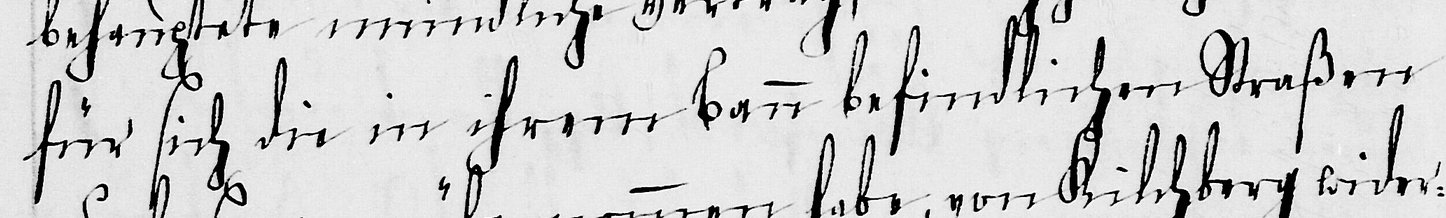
für sich die in ihrem Bann befindlichen Straßen
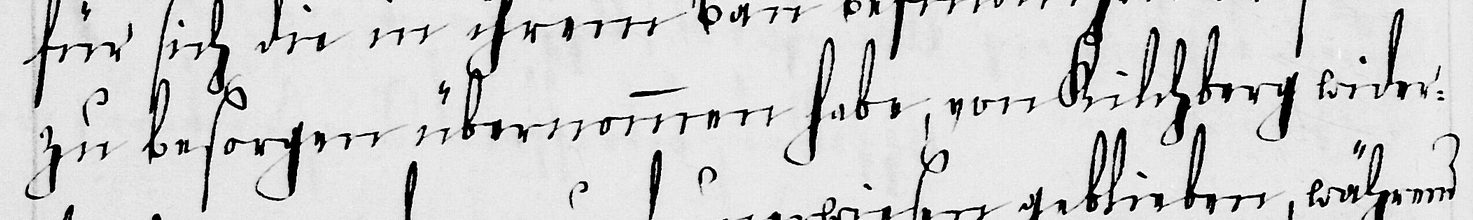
zu besorgen übernommen habe, von Kilchberg wider¬
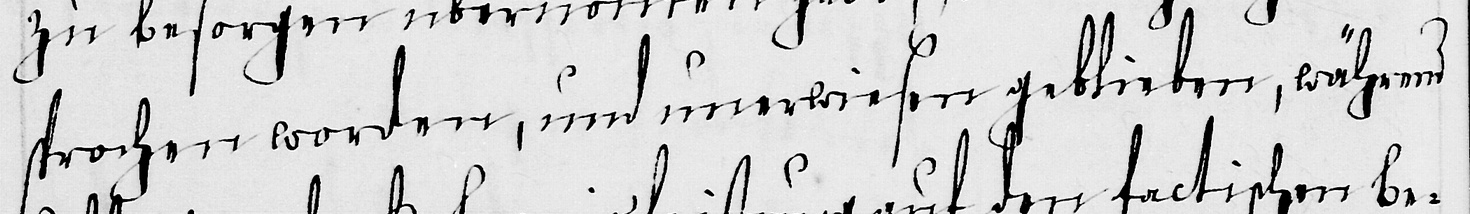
sprochen worden, und unerwiesen geblieben, während
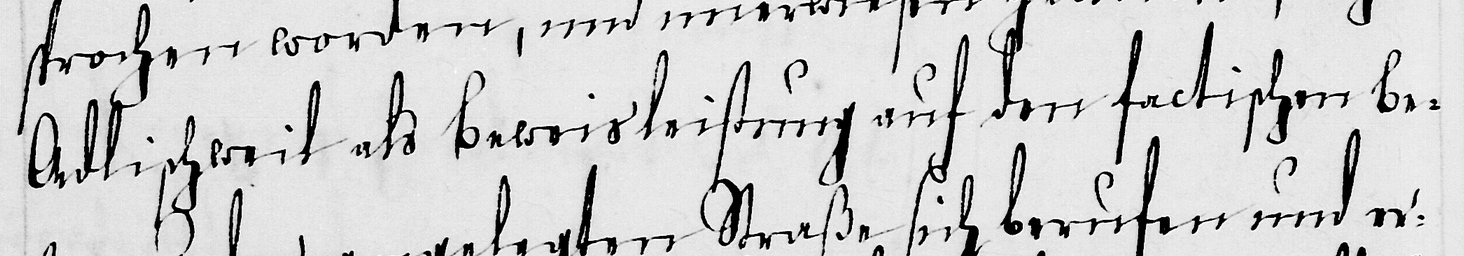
Adlischweil als Beweisleistung auf den factischen Be¬
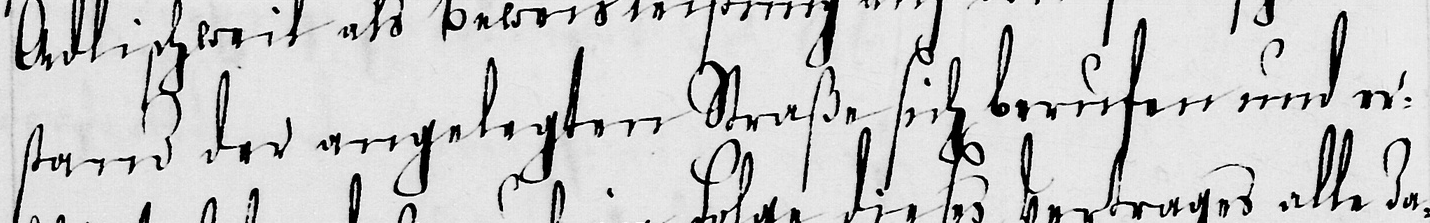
stand der angelegten Straße sich berufen und er¬
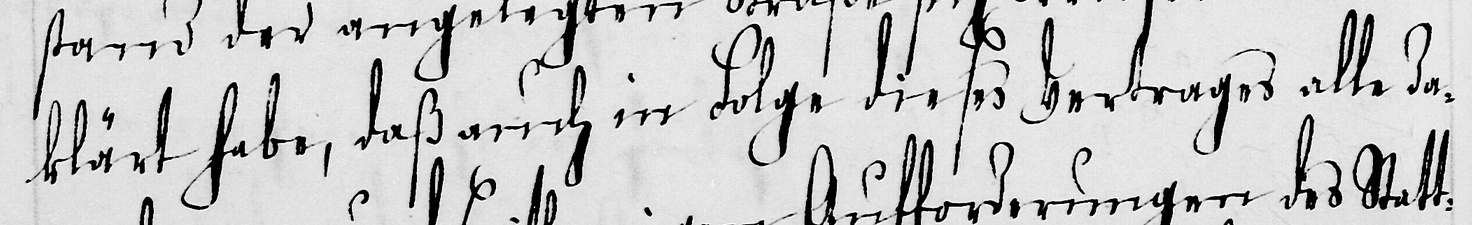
klärt habe, daß auch in Folge dieses Vertrages alle d¬
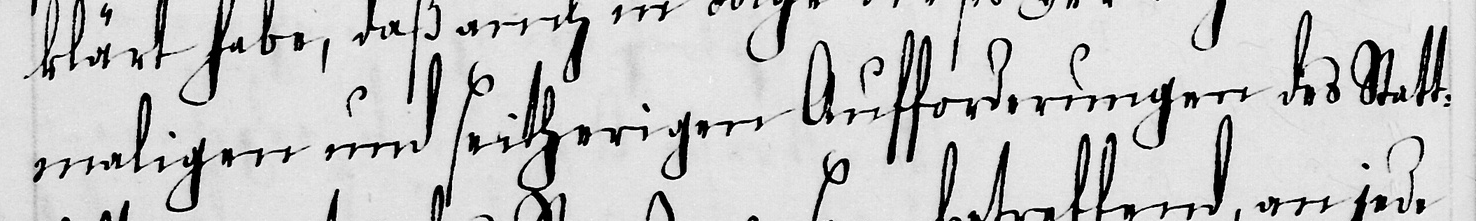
amaligen und seitherigen Aufforderungen des Stat¬
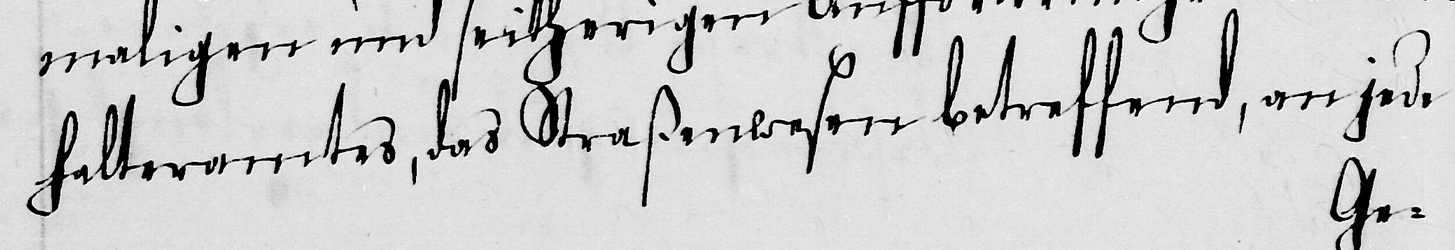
thalteramtes, das Straßenwesen betreffend, an jede
